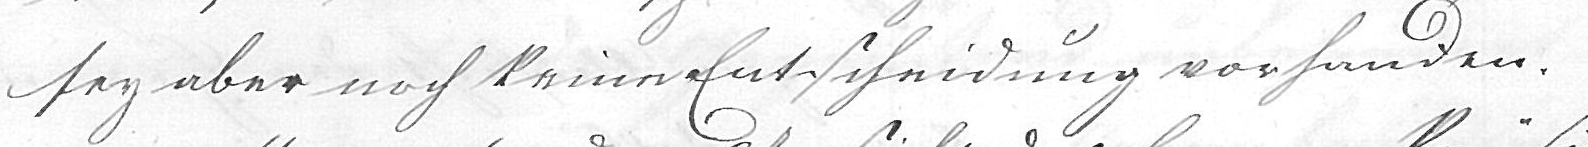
sey aber noch keine Entscheidung vorhanden.
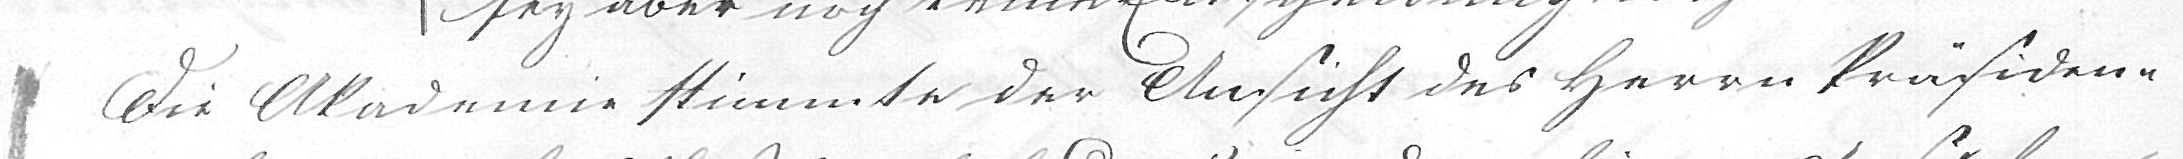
Die Akademie stimmte der Ansicht des Herrn Präsiden-
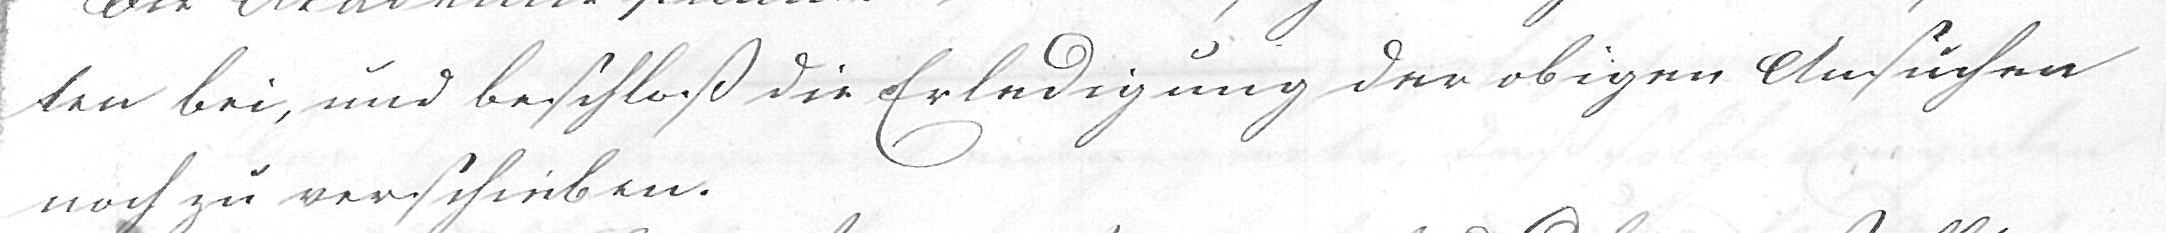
ten bei, und beschloß die Erledigung der obigen Ansuchen
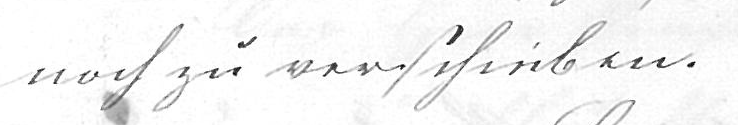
noch zu verschieben.
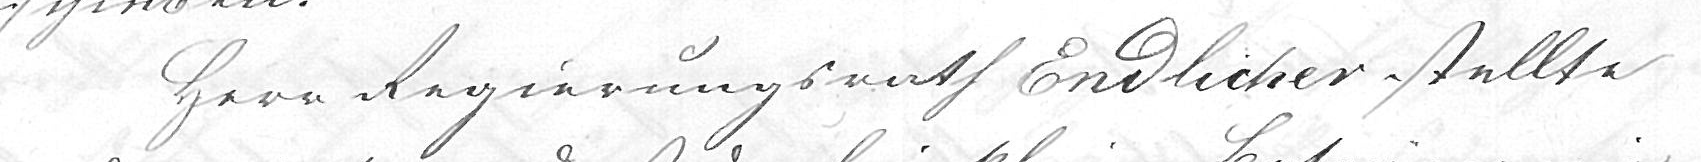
Herr Regierungsrath Endlicher stellte
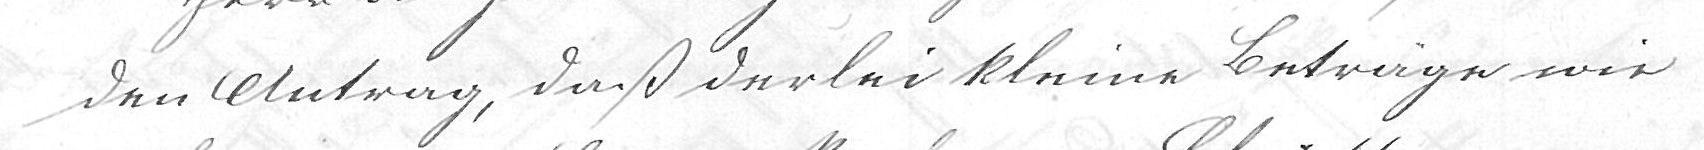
den Antrag, daß derlei kleine Beträge wie
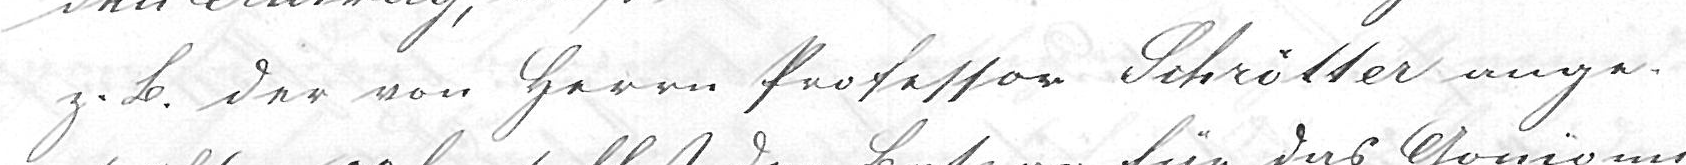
z.B. der von Herr Professor Schrötter ange-
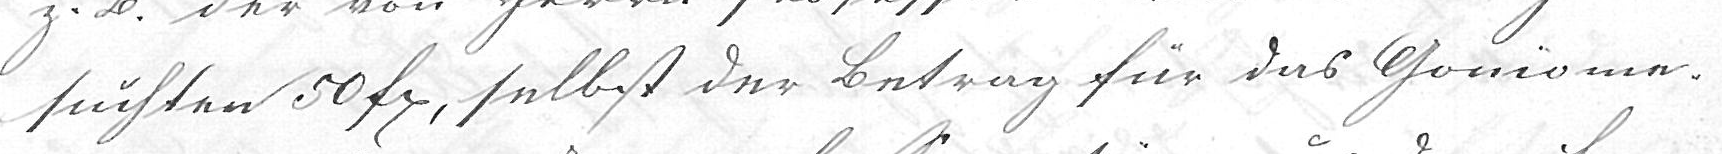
suchten 50 fr, selbst der Betrag für das Goniome-
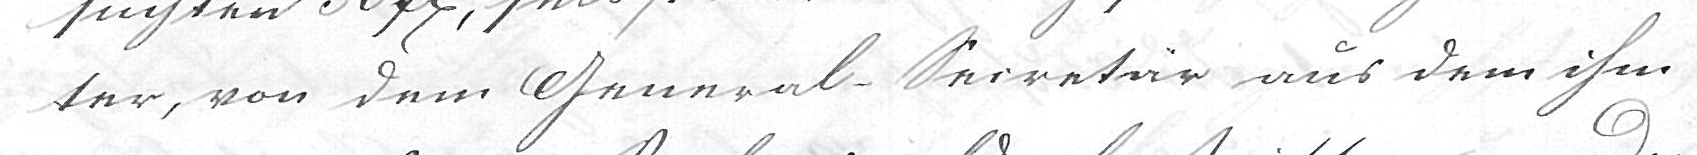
ter, von dem General-Secretär aus dem ihm
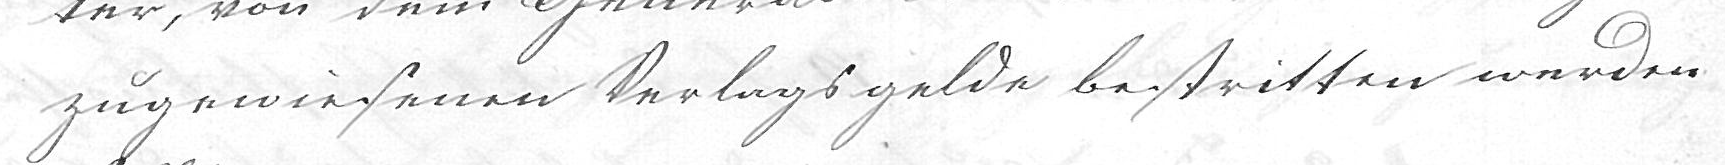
zugewiesenen Verlagsgelde bestritten werden
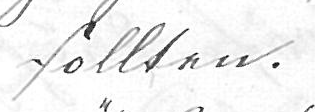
sollten.
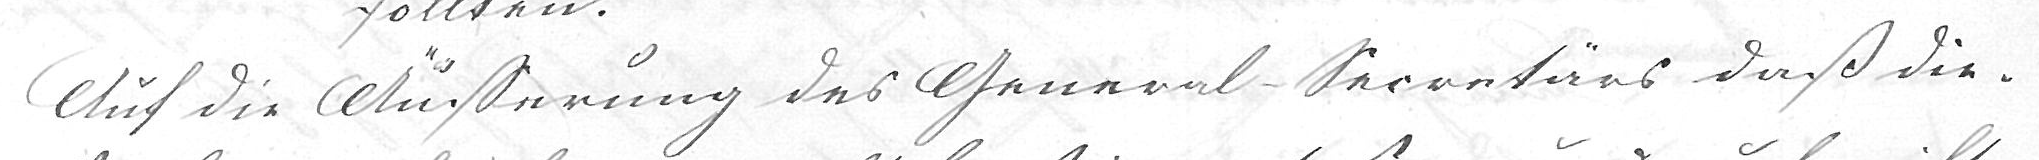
Auf die Äusserung des General-Secretärs daß die-
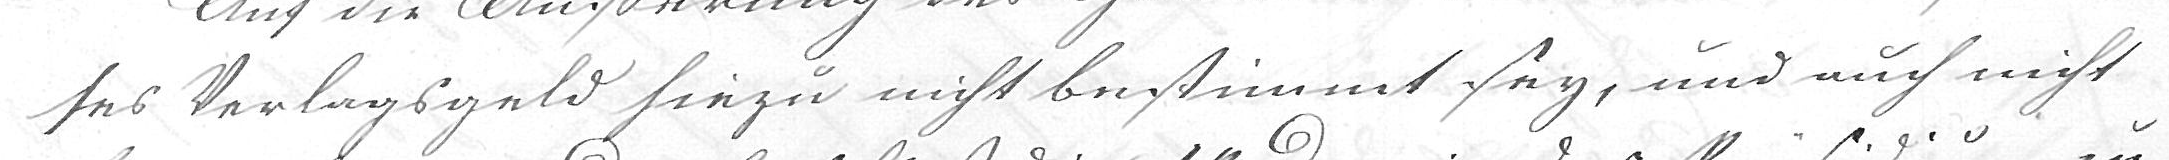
ses Verlagsgeld hiezu nicht bestimmt sey, und auch nicht
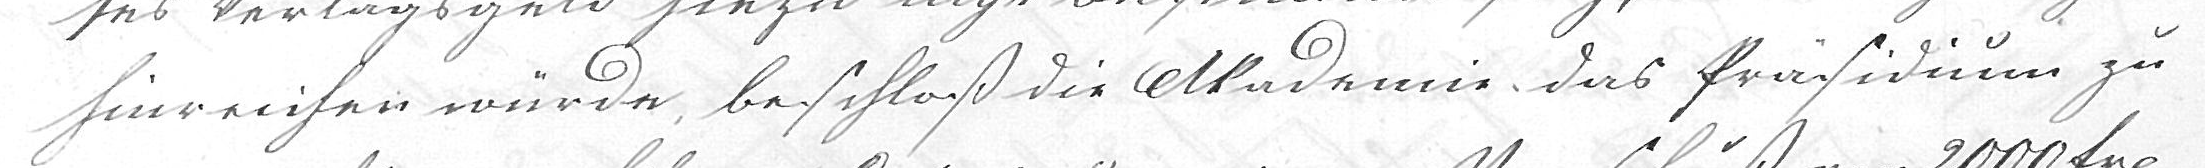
hinreichen würde, beschloß die Akademie das Präsidium zu
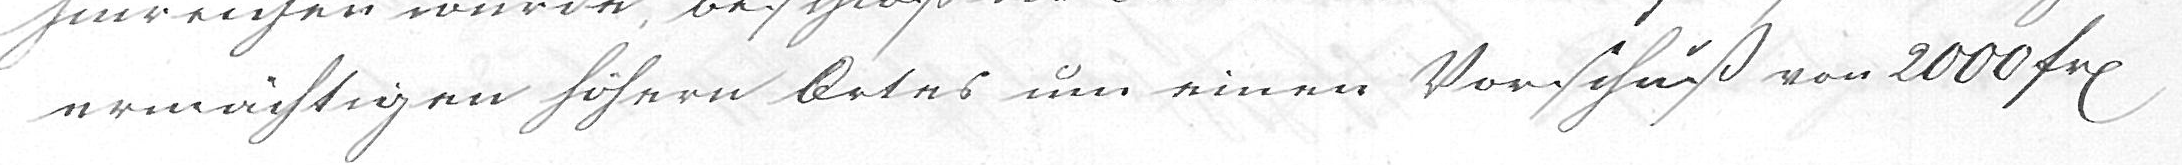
ermächtigen höhern Ortes um einen Vorschluß von 2000 fr
